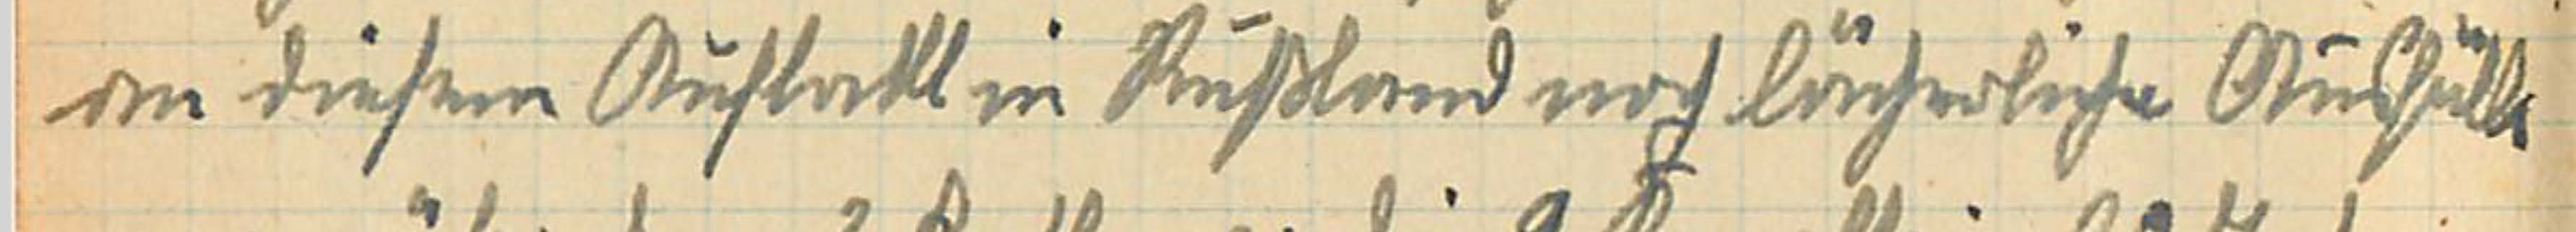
an diesem Auftakt in Rußland noch lächerliche Ausfälle
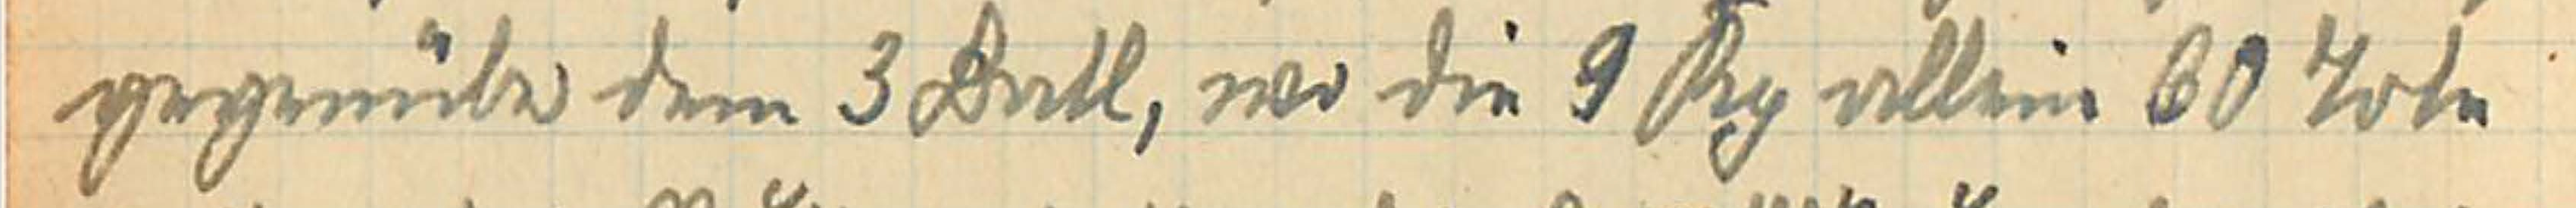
gegenüber dem 3. Batl, wo die 9 Kp allein 60 Tote
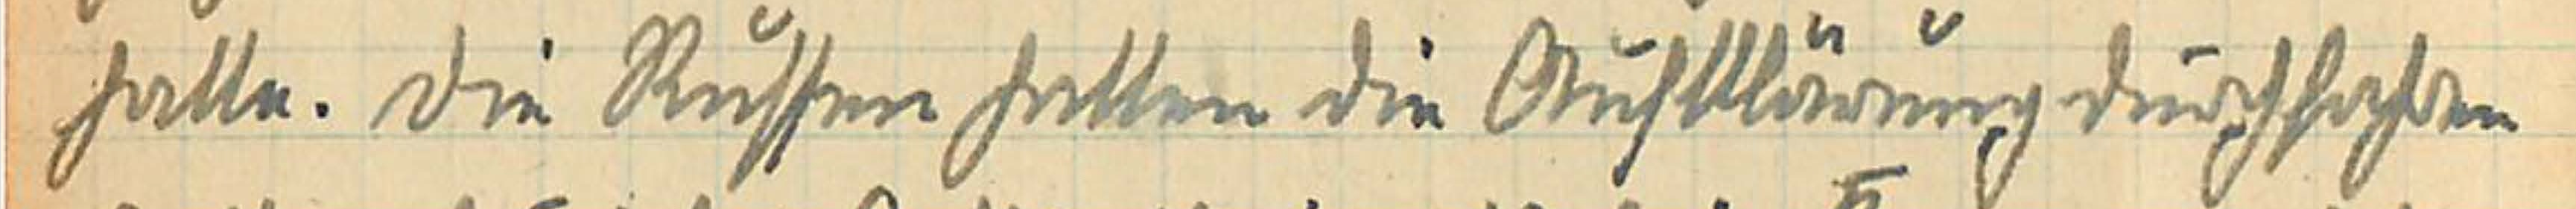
hatte. Die Russen hatten die Aufklärung durchfahren
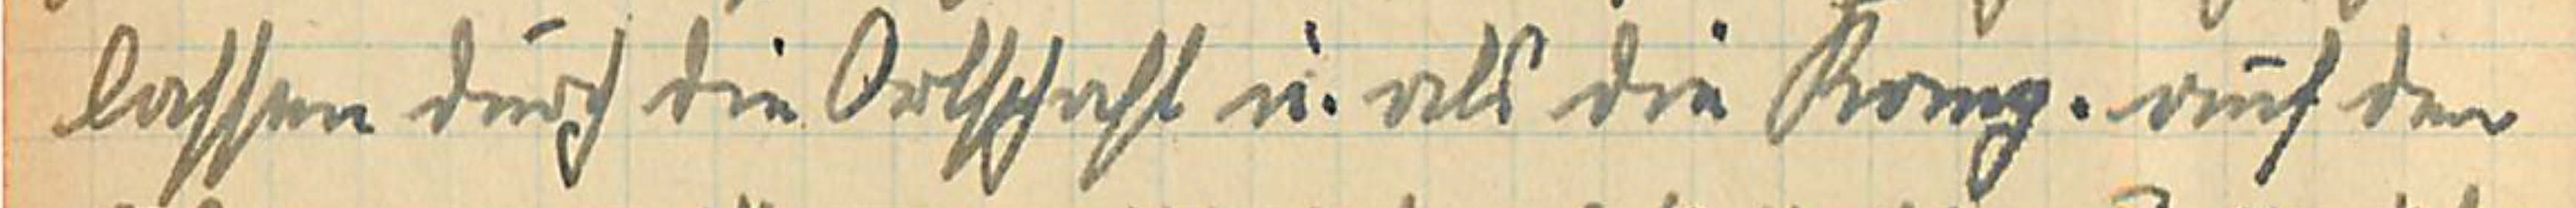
lassen durch die Ortschaft u. als die Komp. auf den
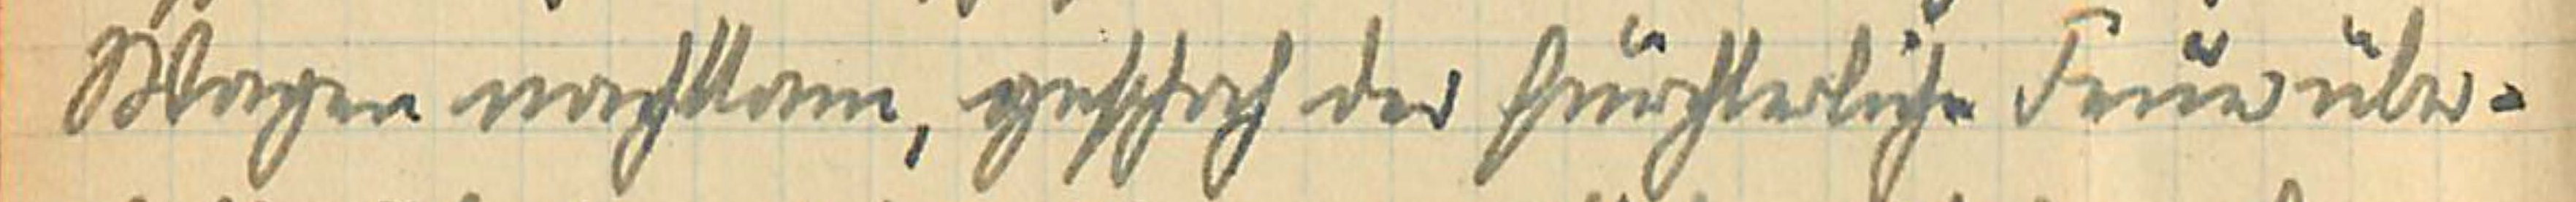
Wagen nachkam, geschah der fürchterliche Feuerüber-
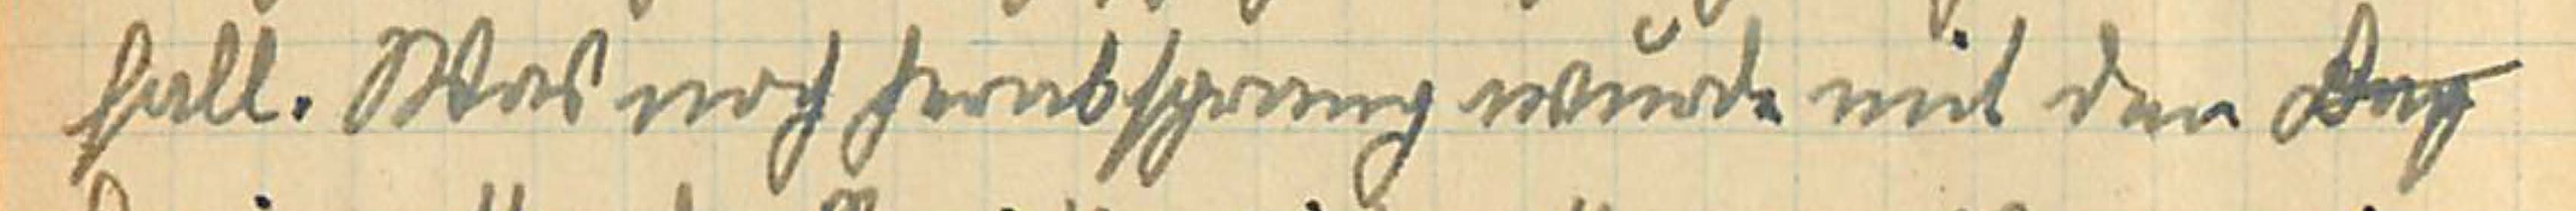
fall. Was noch herabsprang wurde mit den Bap
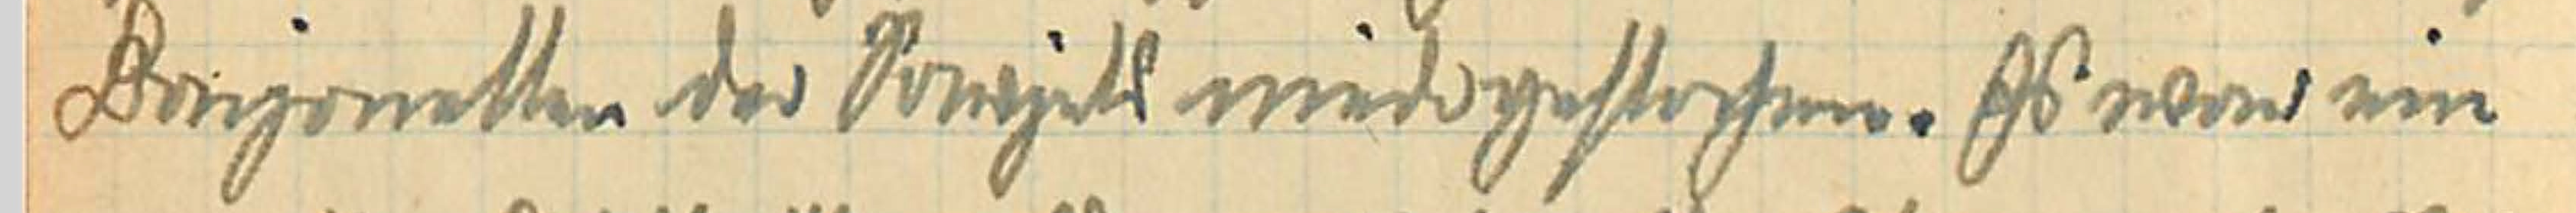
Bajonetten der Sowjets niedergestochen Es war ein
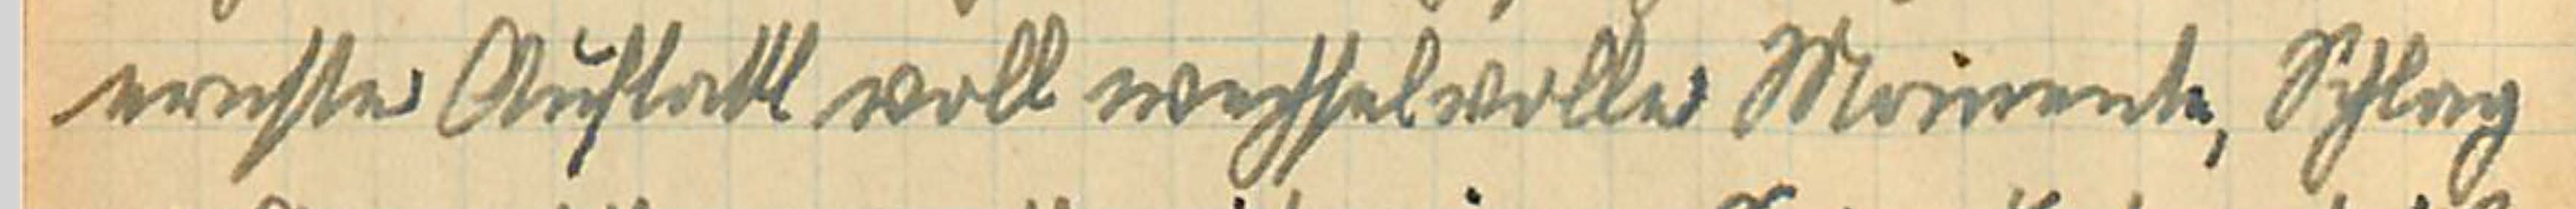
ernster Auftakt voll wechselvoller Momente, Schlag
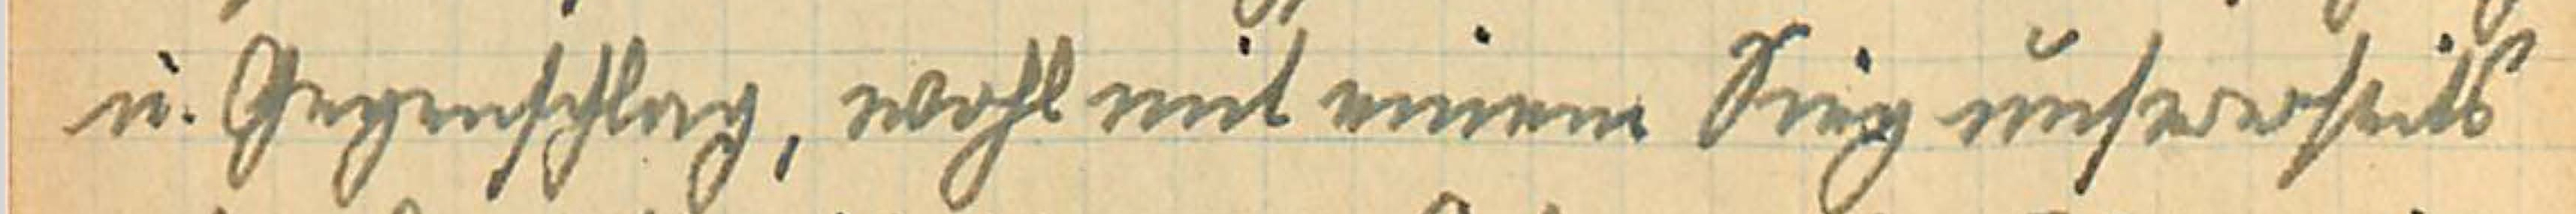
u. Gegenschlag, wohl mit einem Sieg unsererseits
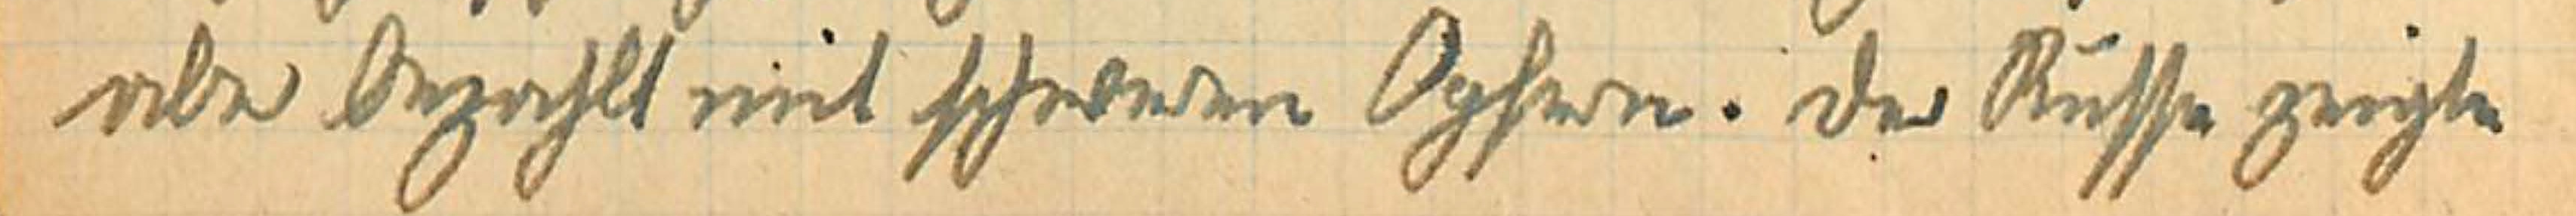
aber bezahlt mit schweren Opfern. Der Russe zeigte
